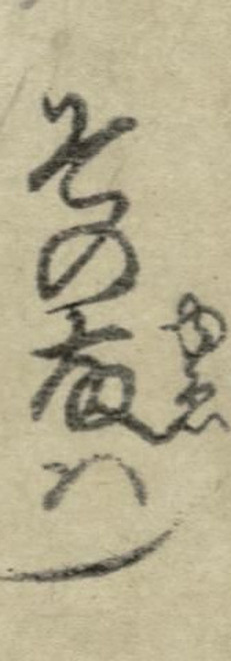その故は
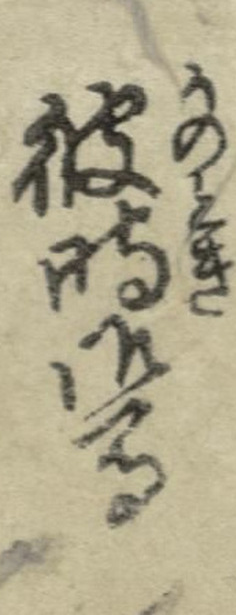彼時御馬
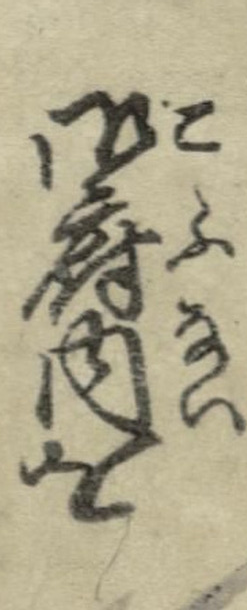御府内を
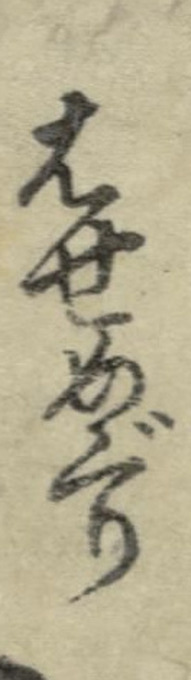はせめぐり
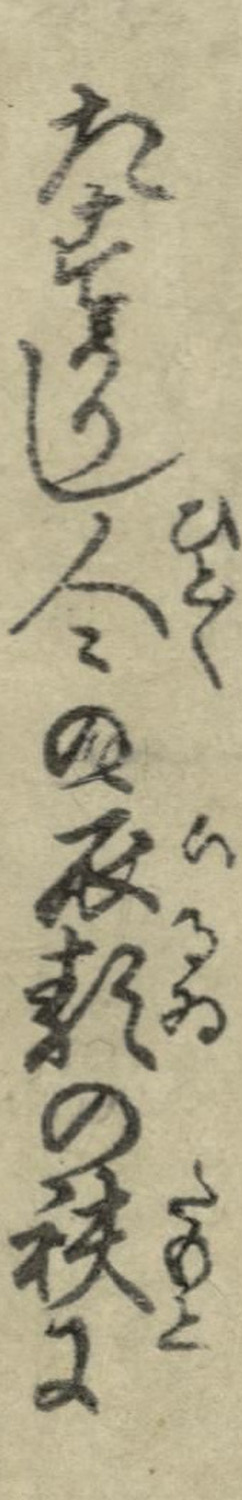たすかりし人〻の衣類の袂に
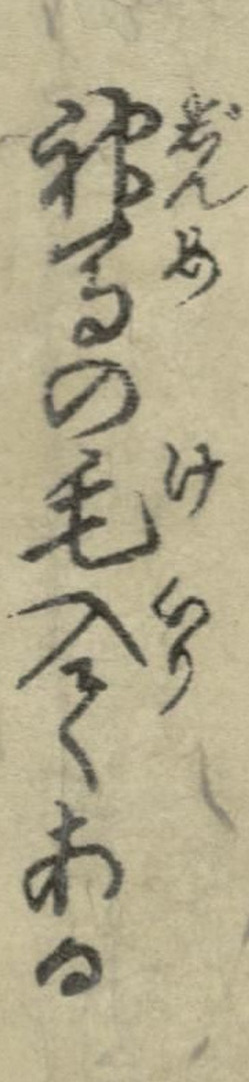神馬の毛入てある
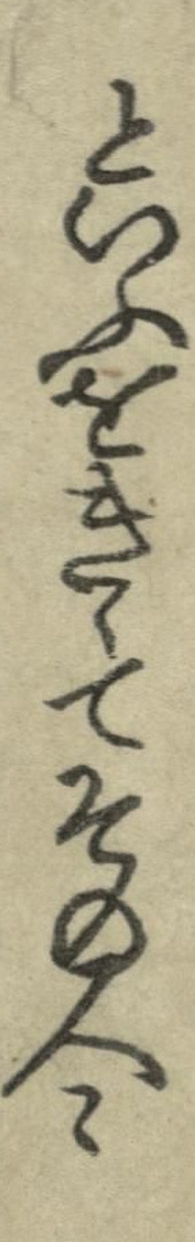といふをきゝてその人〻
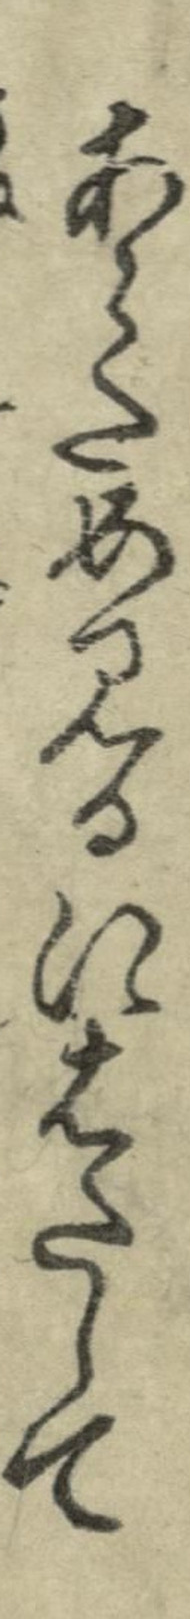あらため見るにはたして
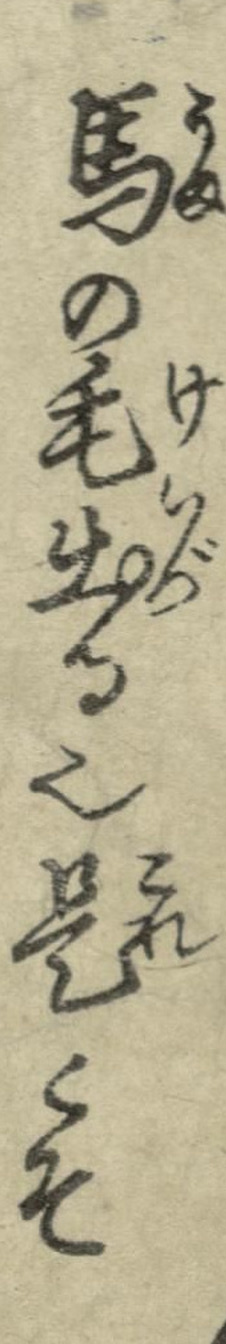馬の毛出る也是こそ
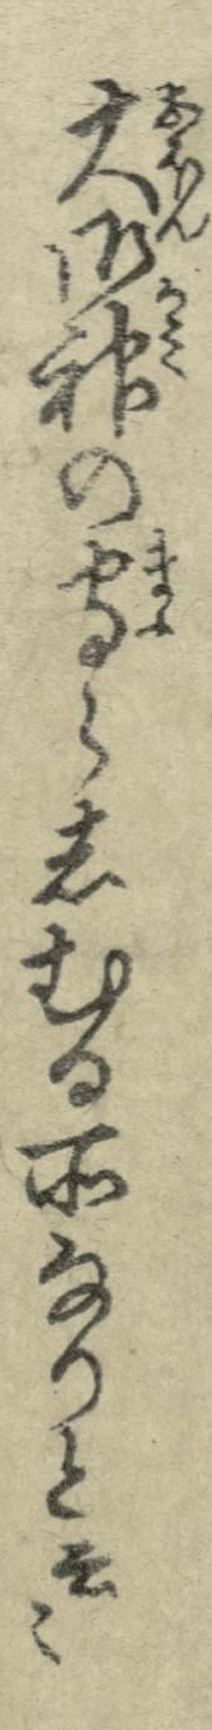大御神の守らしむる所なりと云〻
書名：[鯰をけちらす伊勢神宮・神馬]
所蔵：東京大学地震研究所図書室 Earthquake Research Institute Library, The University of Tokyo, JAPAN
